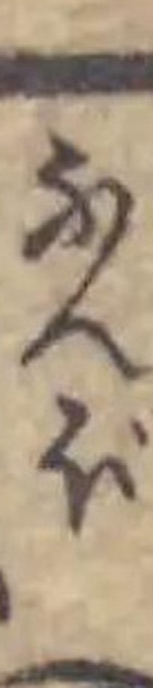なんぼ
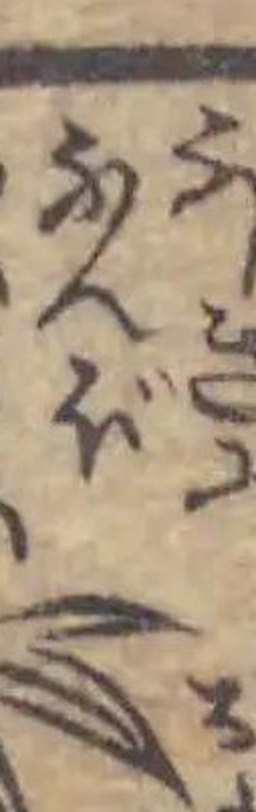なんぼ
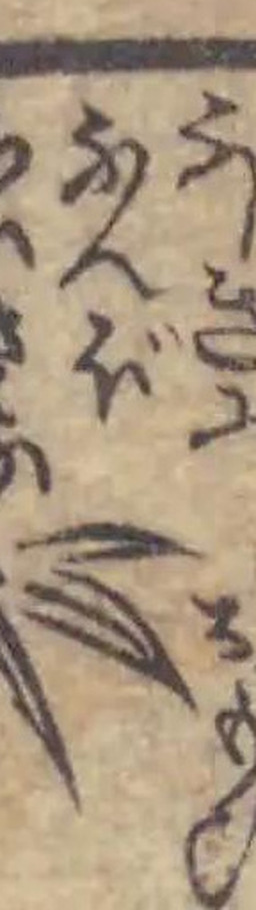なんぼ
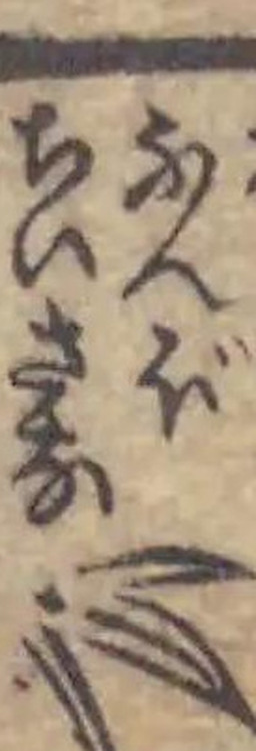ちいさな
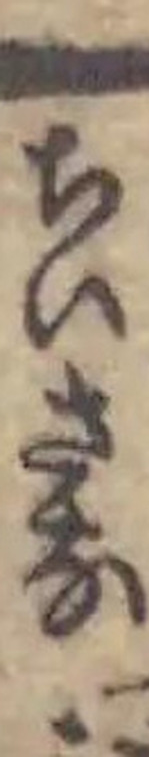ちいさな
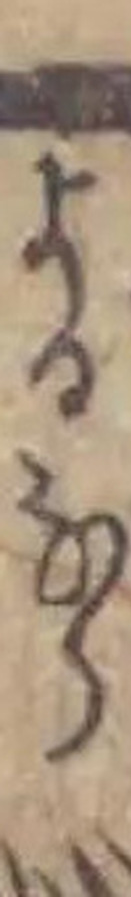よるなら
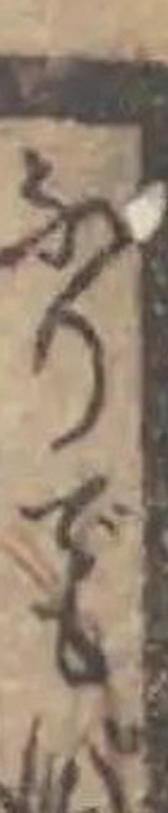なりでも
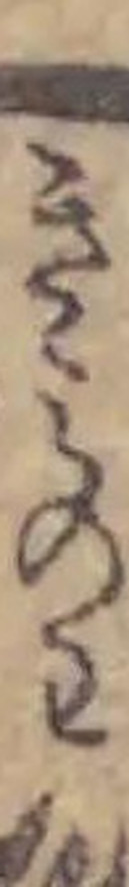きミのわ
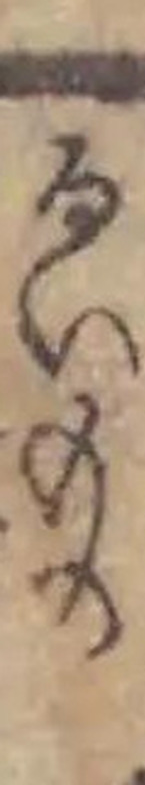るいもの
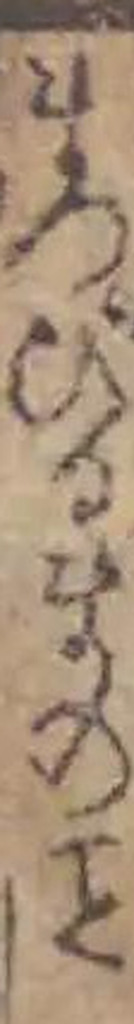まつひるまのこと
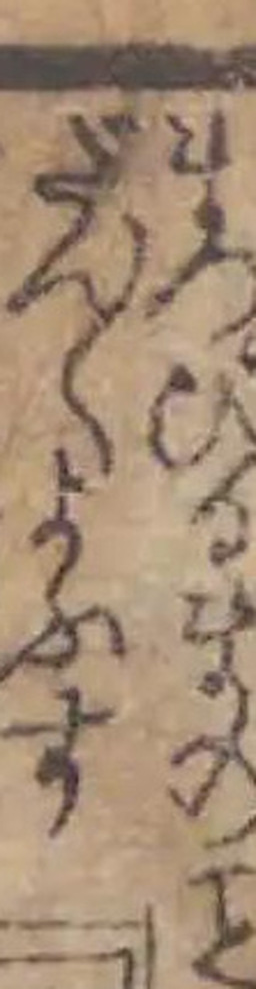だん〳〵よふす
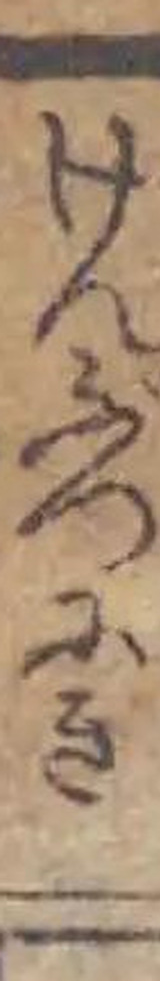けんぶつにき
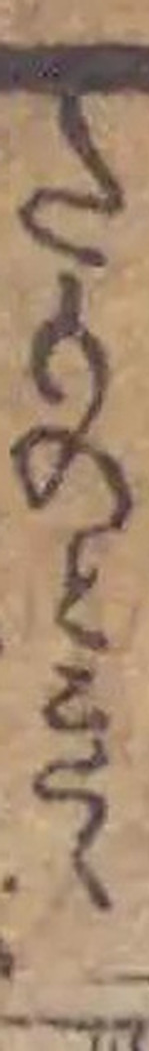たものときゝ
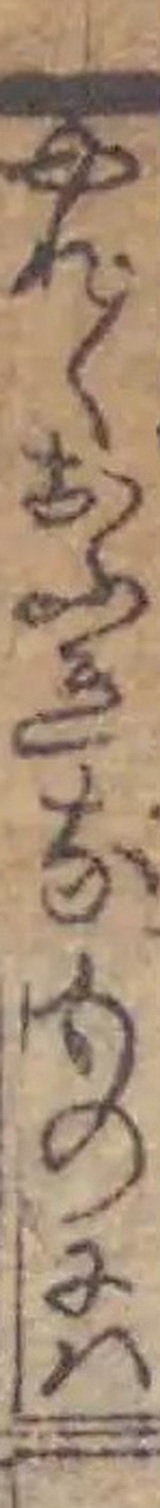やれ〳〵おふきなものにハ
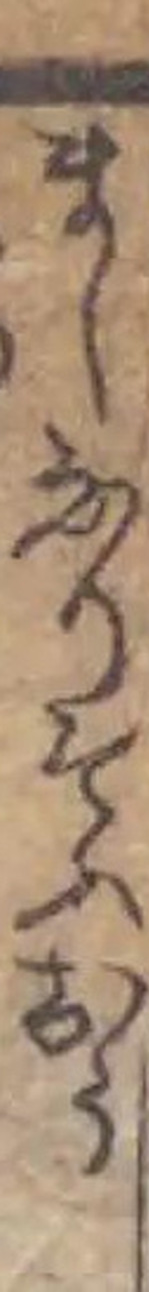ましなりそふおう
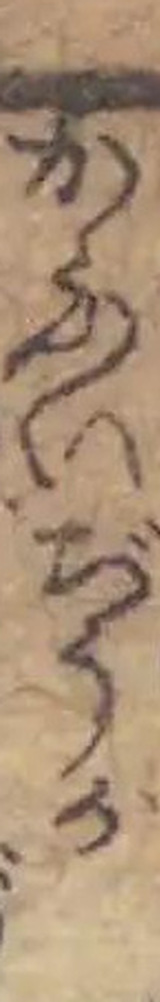かないぢうか
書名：豆男江戸見物 2巻
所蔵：国立国会図書館 National Diet Library, JAPAN
